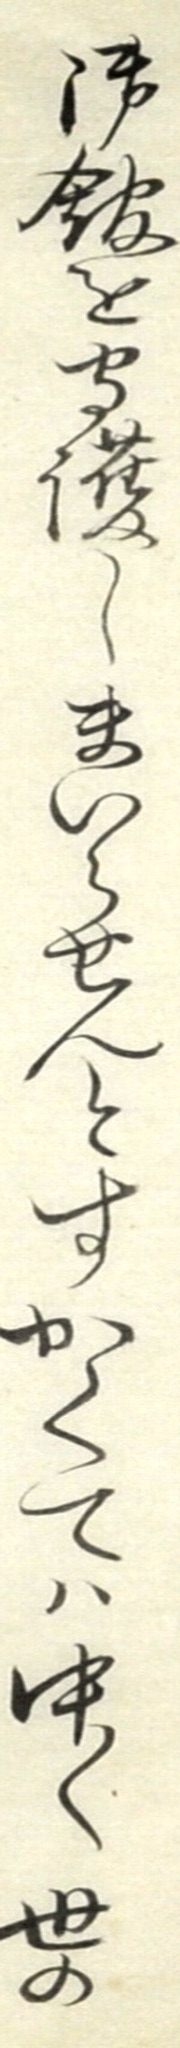御館を守護しまいらせんとすかくては中〳〵世の
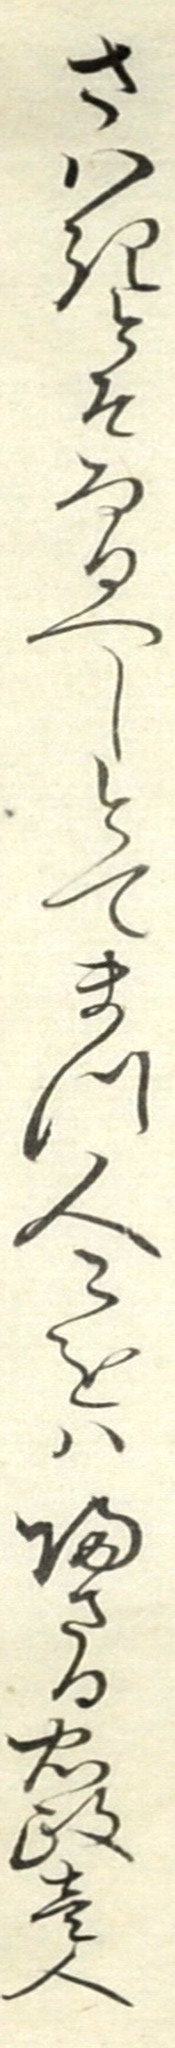さはきとそなるへしとてまつ人々をは帰さる忠政壱人
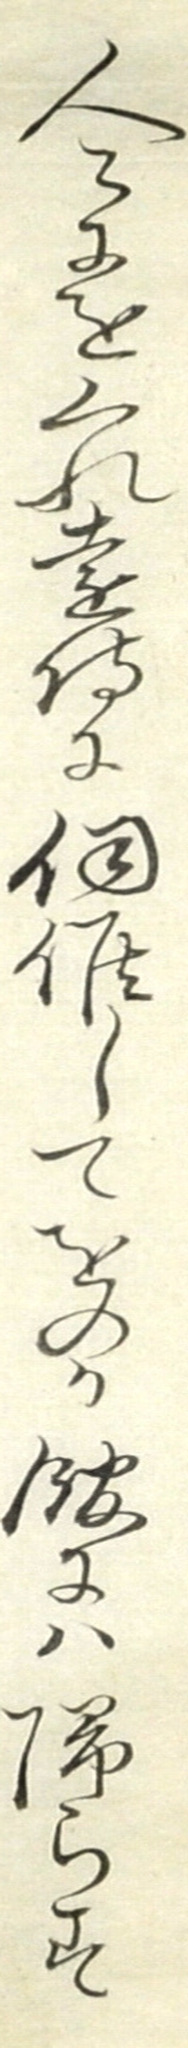人々にをくれ遠侍に伺候してをのか館には帰らす
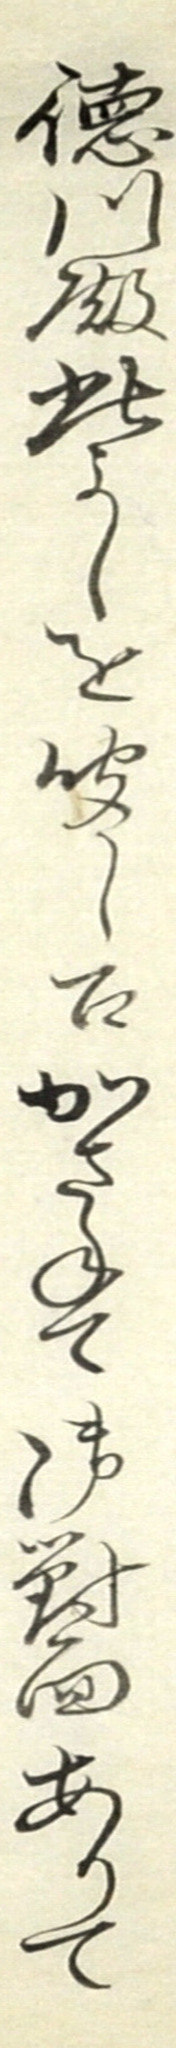徳川殿此よしを聞し召かさねて御対面ありて
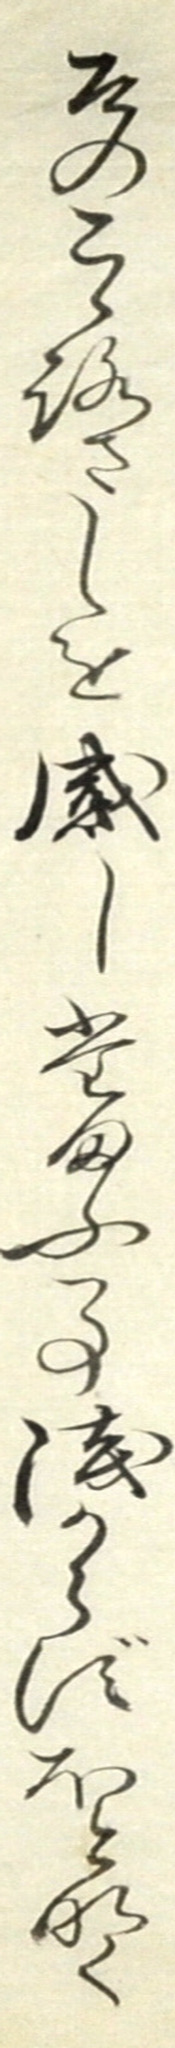そのこゝろさしを感したまふ事浅からずほとなく
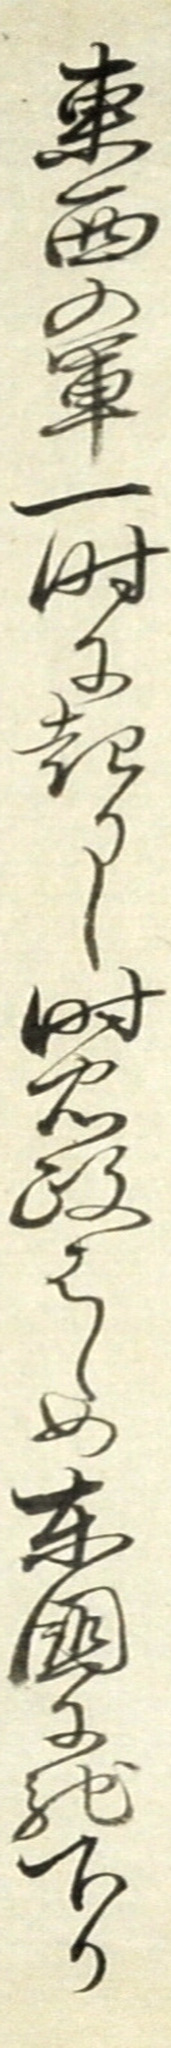東西の軍一時に起りし時忠政はしめ東国に馳下り
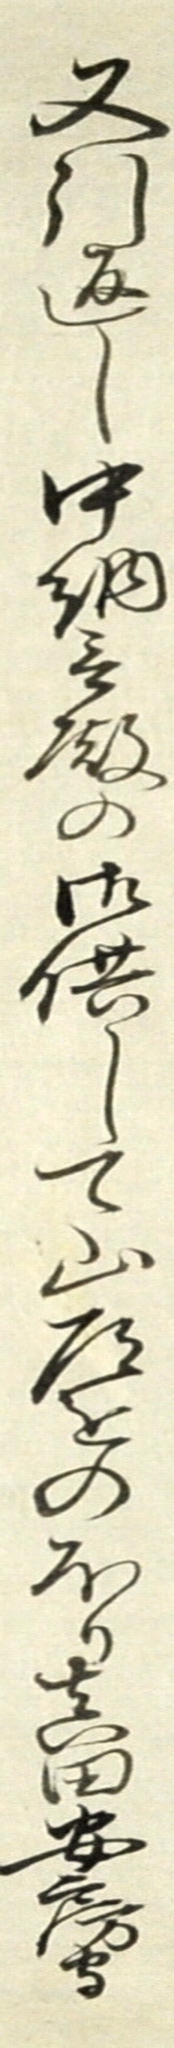又引返し中納言殿の御供して山道をのほり真田安房守
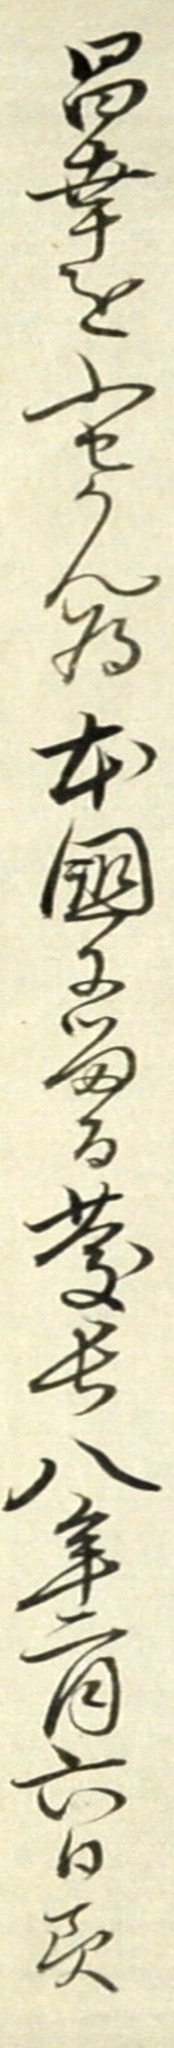昌幸をふせかん為本国に留る慶長八年二月六日美

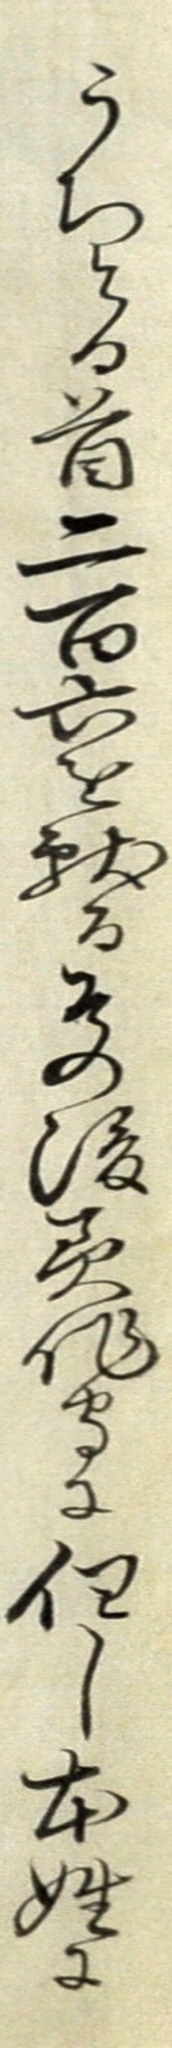うちとる首二百六を献るその後美作守に任し本姓に
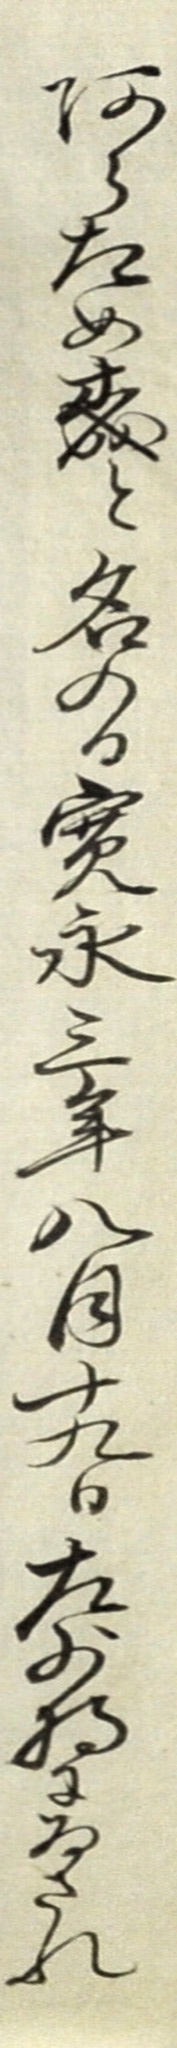あらため森と名のる寛永三年八月十九日左少将になされ
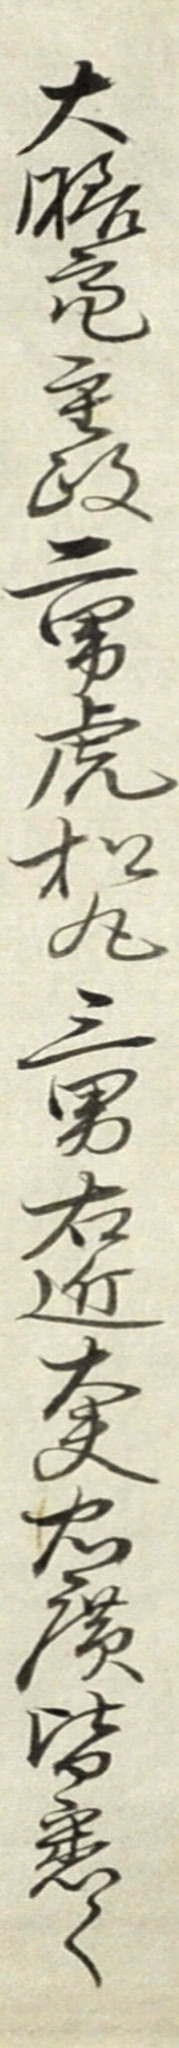大膳亮重政二男虎松丸三男右近大夫忠広皆悉く
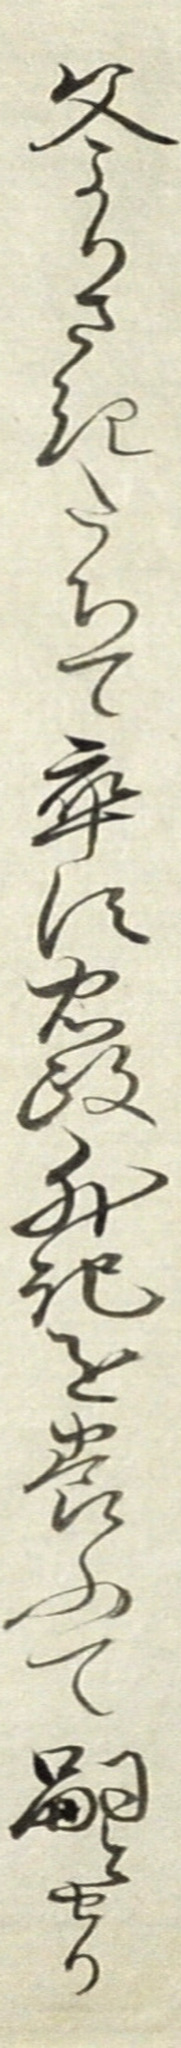父よりさきたちて卒す忠政外記を養ふて嗣とせり
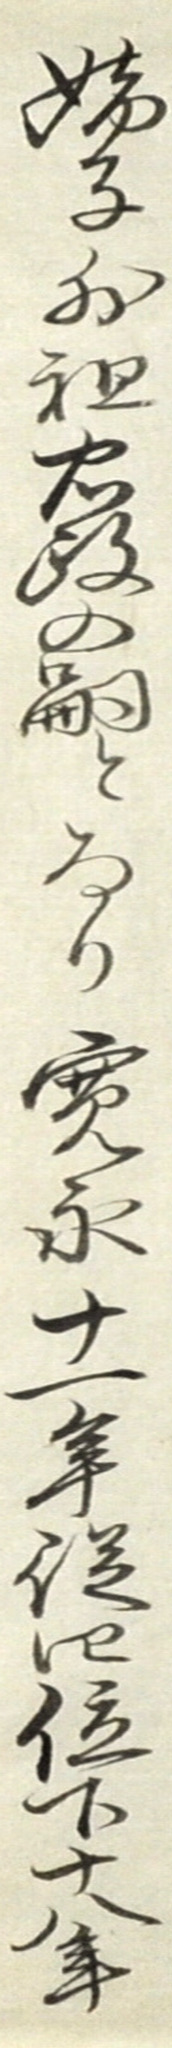嫡子外祖忠政の嗣となり寛永十一年従四位下十八年
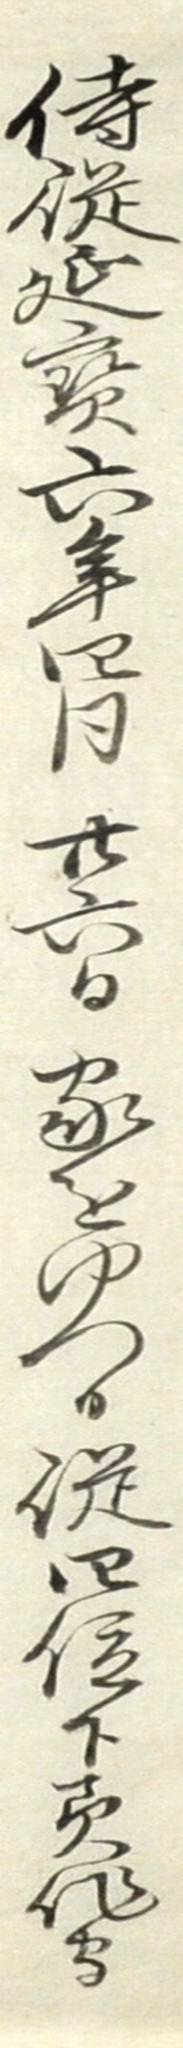侍従延宝六年四月廿六日家をゆつる従四位下美作守
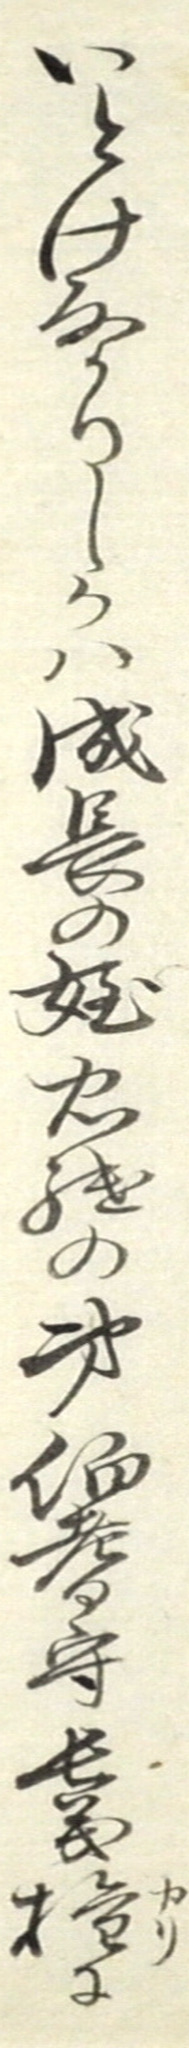いとけなかりしかは成長の姪忠継の弟伯耆守長義権に
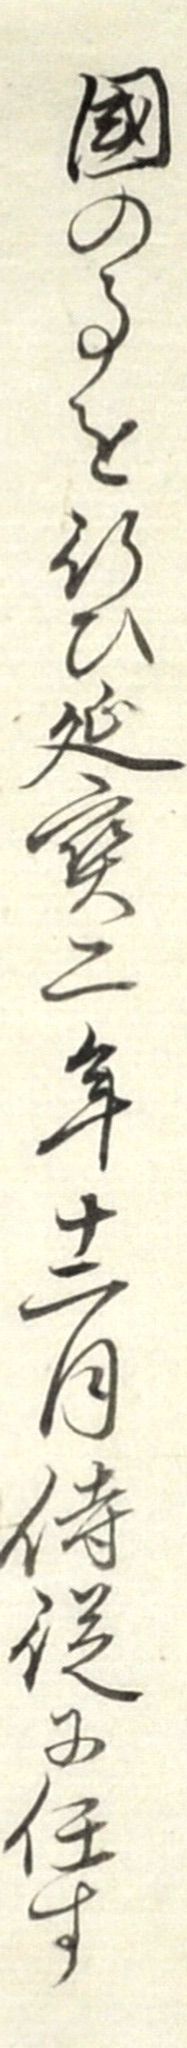国の事を行ひ延宝二年十二月侍従に任す
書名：藩翰譜（七・下）
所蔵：伊那市立高遠町図書館・合同会社AMANE
